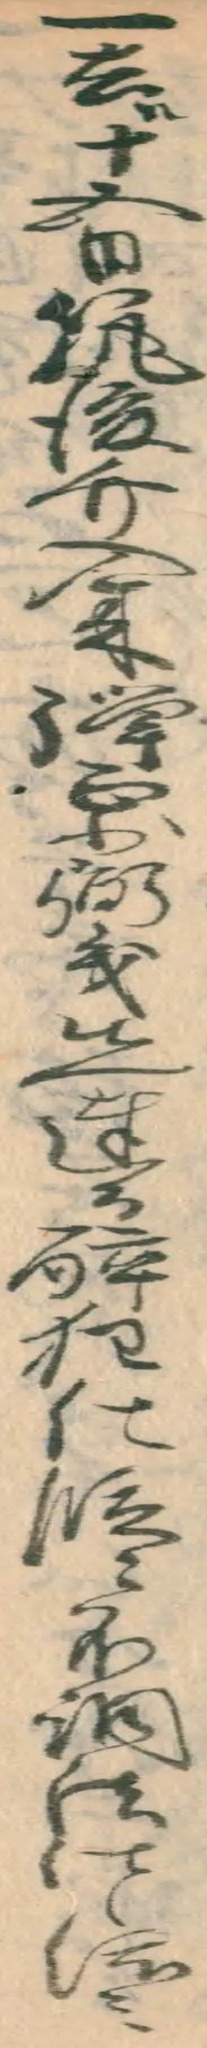一去ル十五日筑後介入来弾正少弼義先達而酔狂仕段々不調法仕候依之
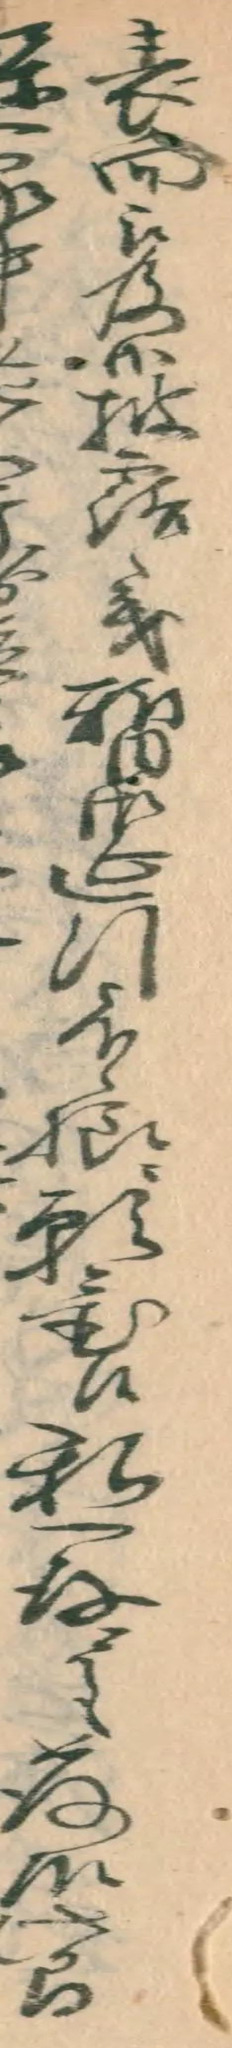表向被及御披露候義暫御延引被下候様ニ願置候私一存ニても如何故此間
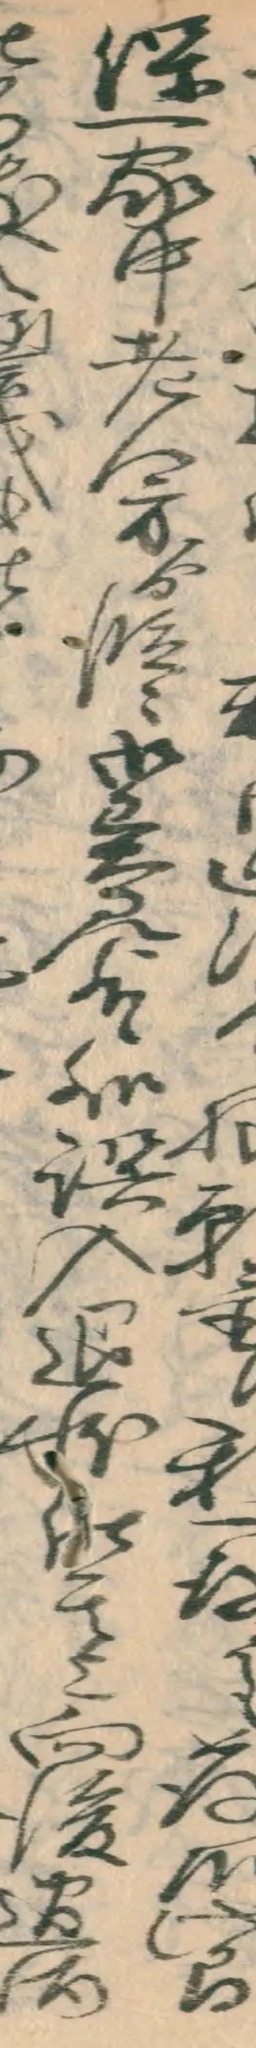保一家中老人方ゟ段々御異見被下候処誤入退状仕其上向後過酒
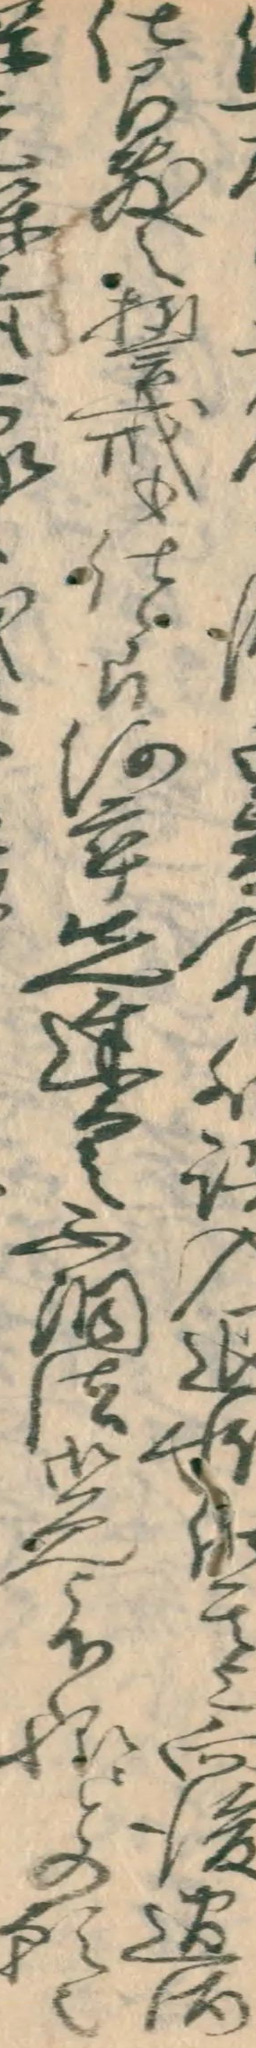仕間敷之誓戒も仕候間何卒先達而不調法御免被下候様ニとの願也
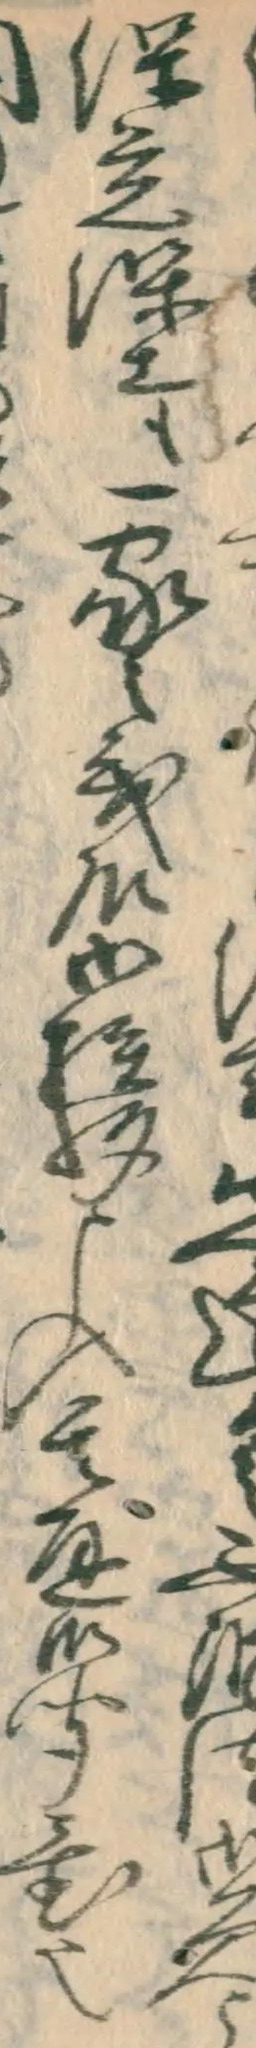保覚保土も一家之義故御挨拶申入其通御聞置也
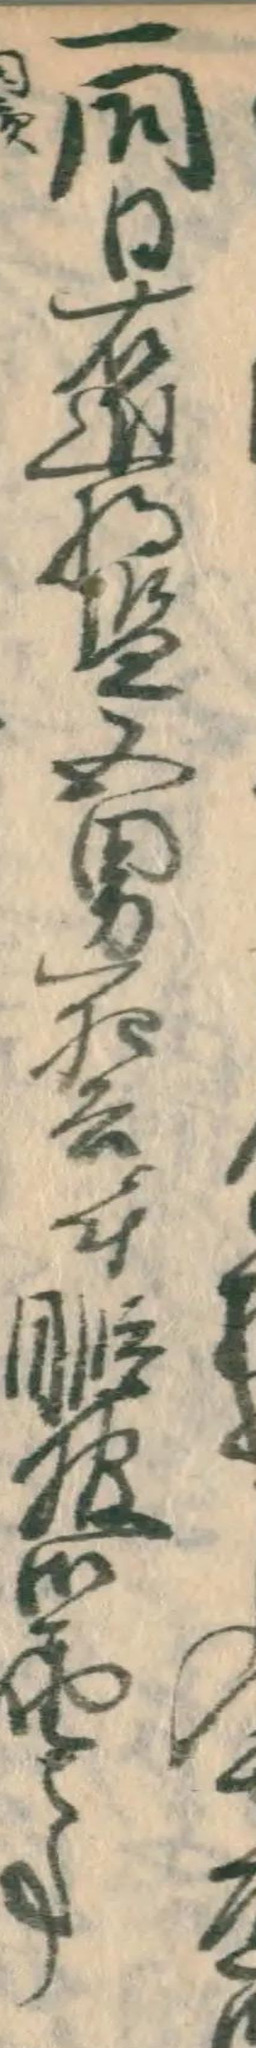一同日右近将監五男死去ニ付暇服御届之事
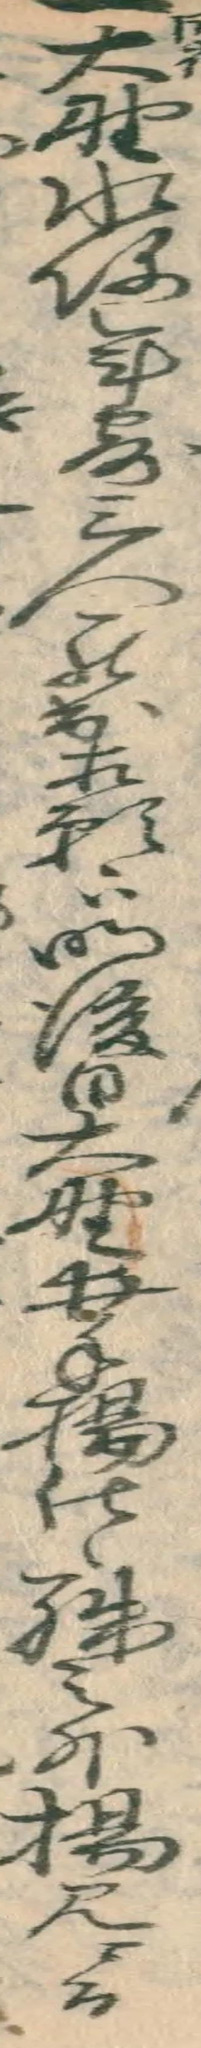一同夜大野水役年寄三人罷出相願候ハ明後日大野井手揚仕候殊之外揚見ニ而
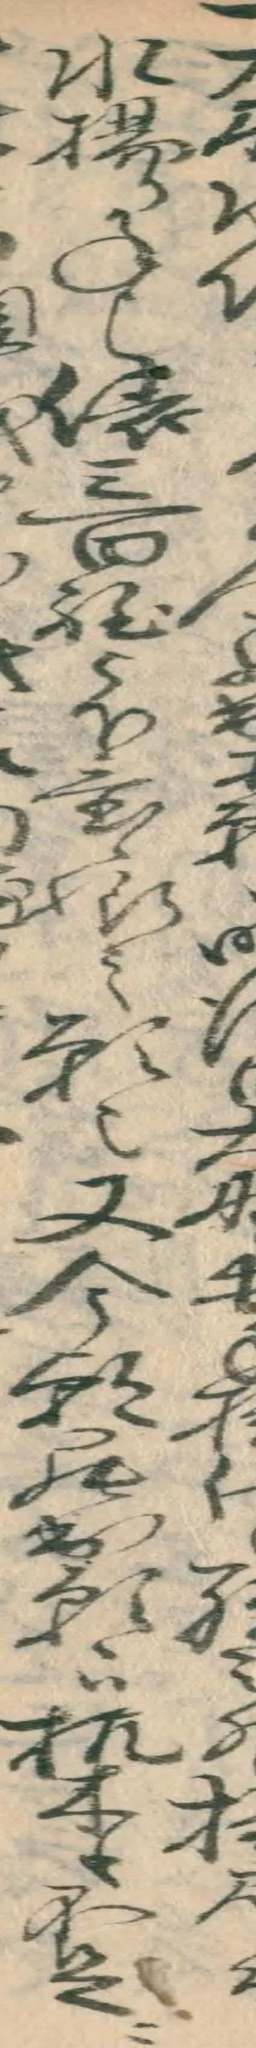水揚りかね申候俵三百程被下置候様之願也又今朝罷出願候ハ杭木も不足ニ
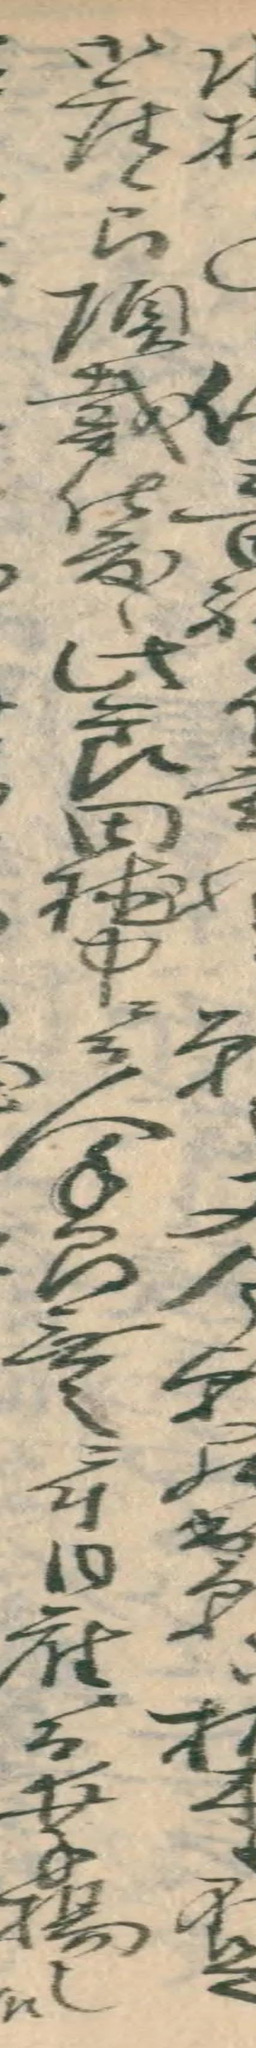御座候間頂戴仕度候此節田植中ニ而人手間無之ニ付日雇ニ而井手揚申候故
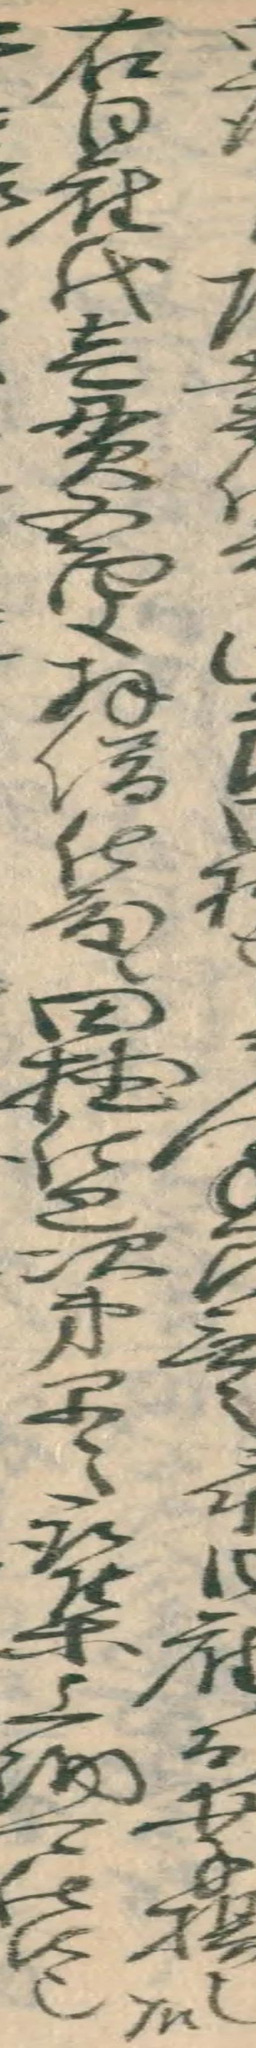右日雇代壱貫五百文拝借仕度候田植仕廻次第早々取集上納可仕由也
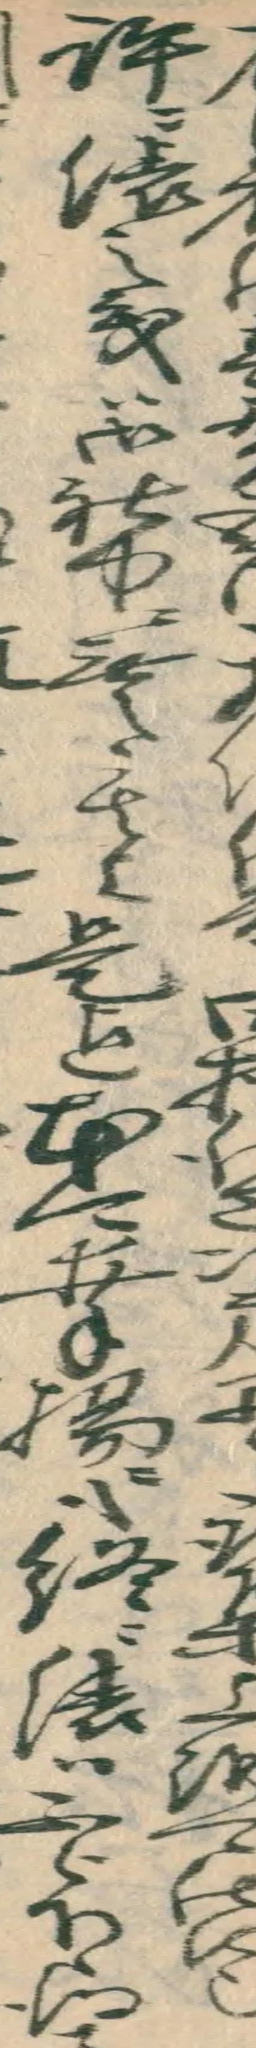許ニ俵之義ハ御社中ニ無之候其上是迄本郷井手揚ニも終ニ俵ハ不被下候得者
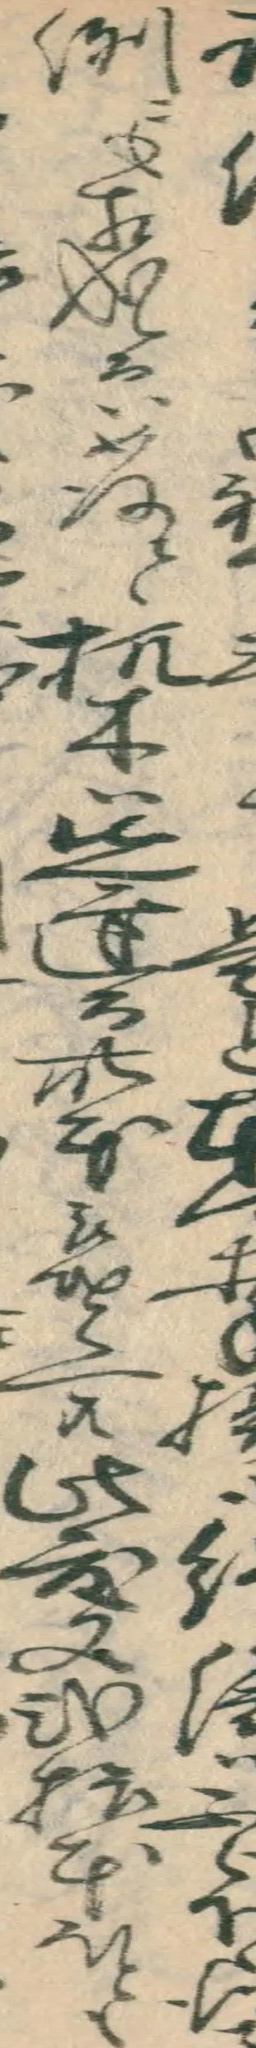例ニも相成候而ハ如何ニ候杭木ハ先達而卅本被遣候へ共此度又弐拾本ほとも
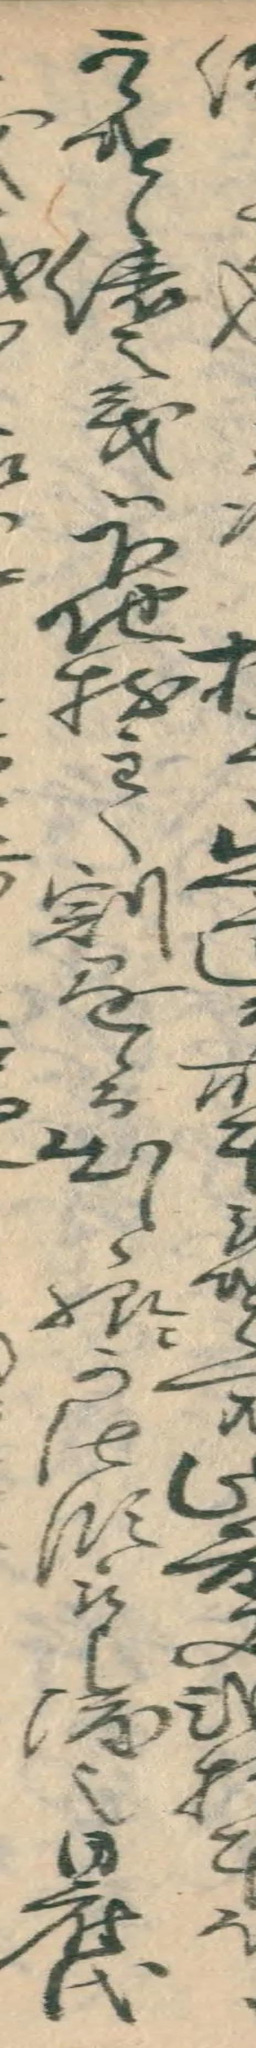可被遣候俵之義ハ下地持主へ割懸候而出し候様ニ可仕段被申渡也日雇代
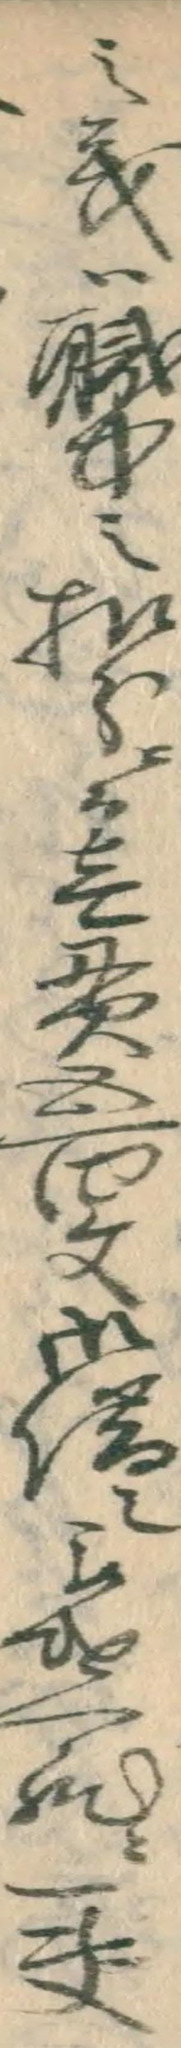之義ハ職中之扣分ニ而壱貫五百文御借シ被遣可然ニ一決
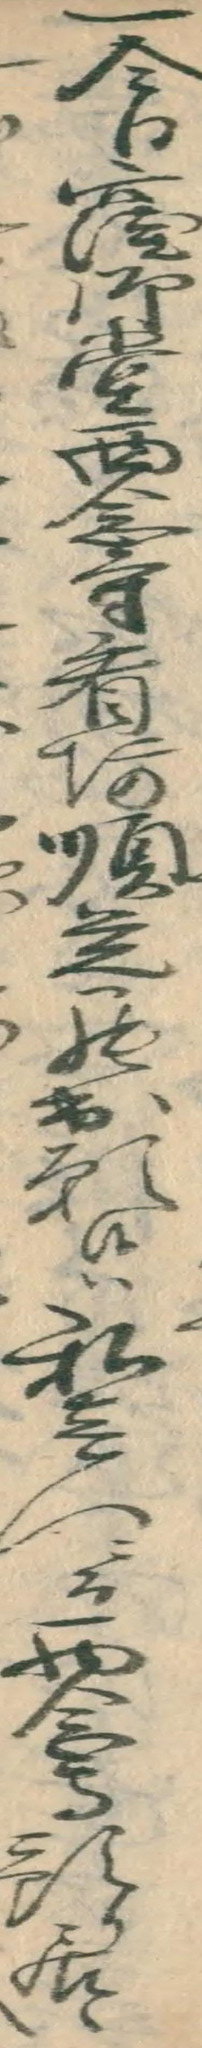一今日窪御堂西念寺看坊順覚罷出願候ハ私壱人ニ而西念寺預り居候も
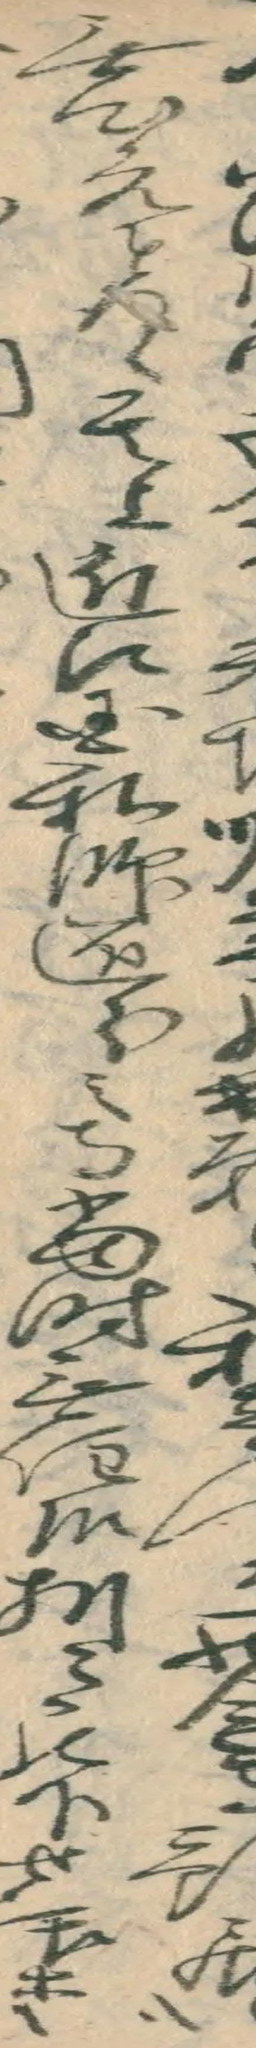無心元奉存候其上近江国私師匠分之寺当時無住故折々罷下世話等も
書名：賀茂社記録. 第58冊
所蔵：国立国会図書館 National Diet Library, JAPAN
